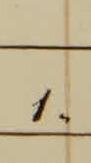1
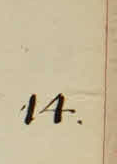14.
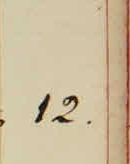12.
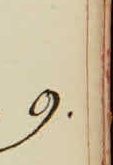9.
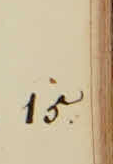15.
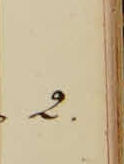2.
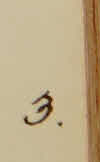3.
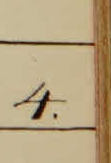4.
